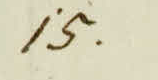15.
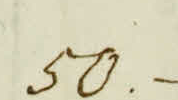50.
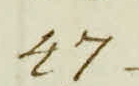47
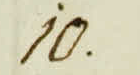10.
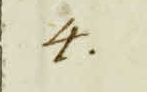4.
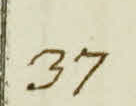37
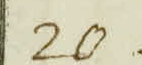20
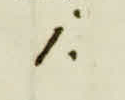1.
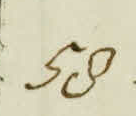58
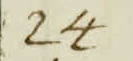24
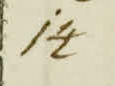14
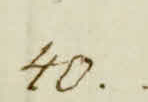40.
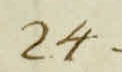24
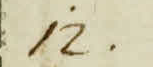12.
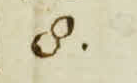8.
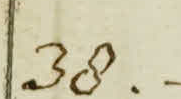38.
